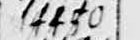14450
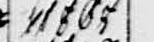11565
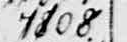7808.
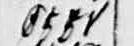6551
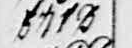5713
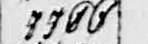1566
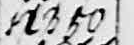12350
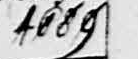1689
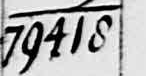79418
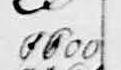6600
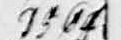7564
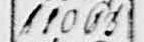11063
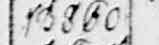13860
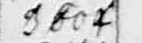3604
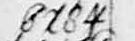6284
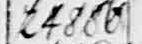24866
